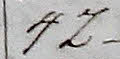42
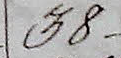38
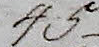45
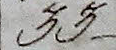33
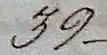39
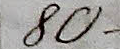80
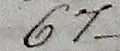67
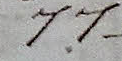77
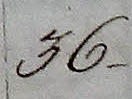36
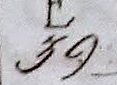39
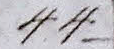44
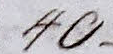40
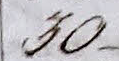30
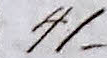41
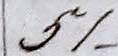51
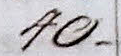40
